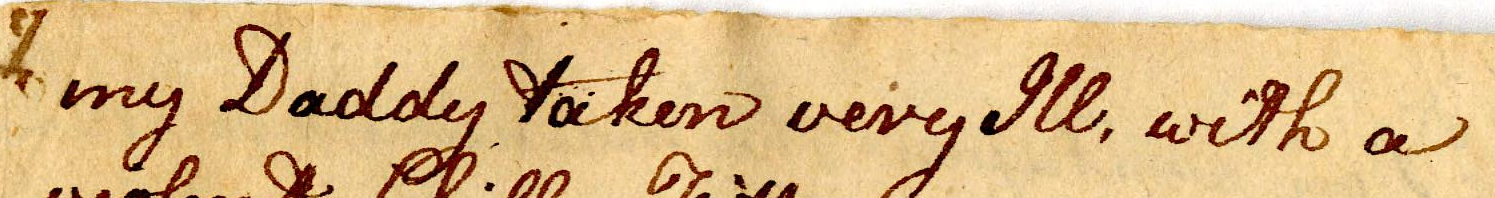^7 my Daddy taken very Ill, with a
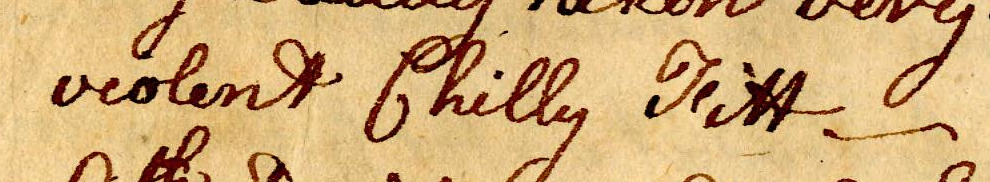violent Chilly Fitt-
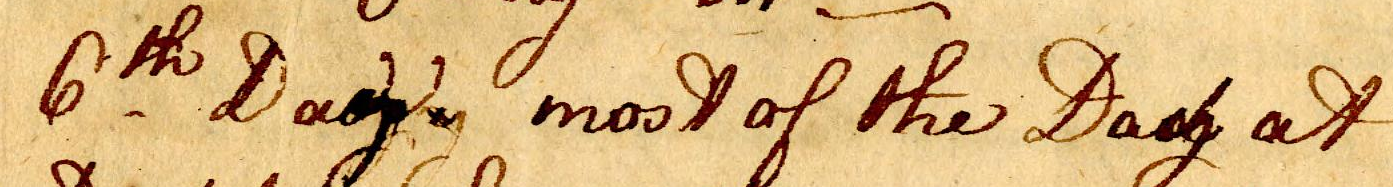6^th. Day most of the Day at
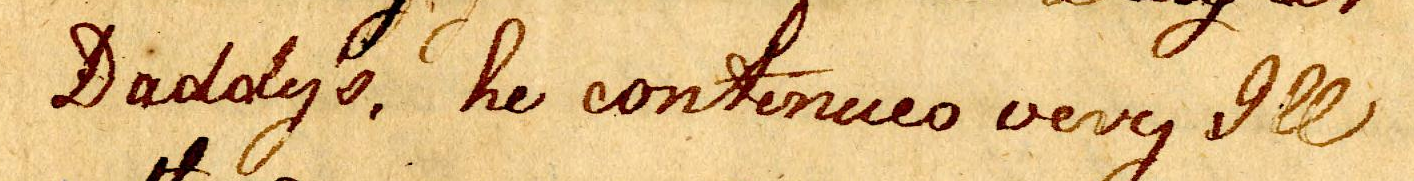Daddy's, he continues very Ill
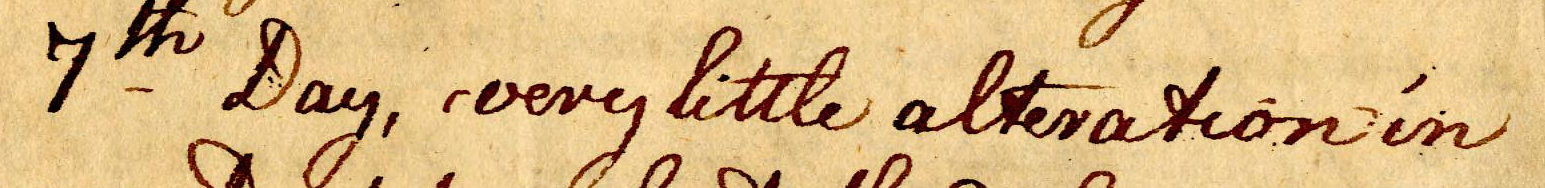7^th Day, very little alteration in
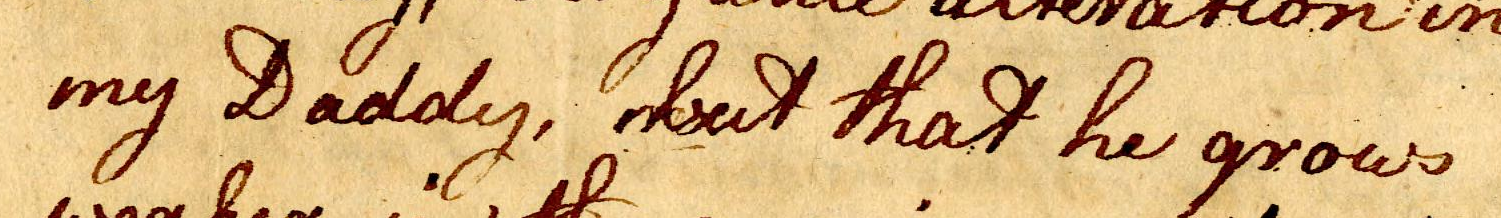my Daddy, but that he grows
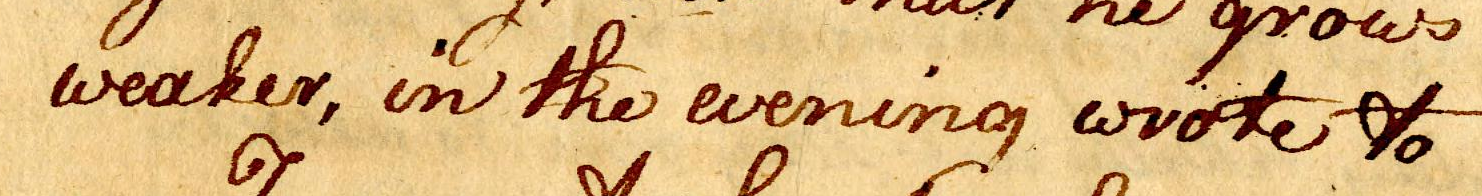weaker, in the evening wrote to
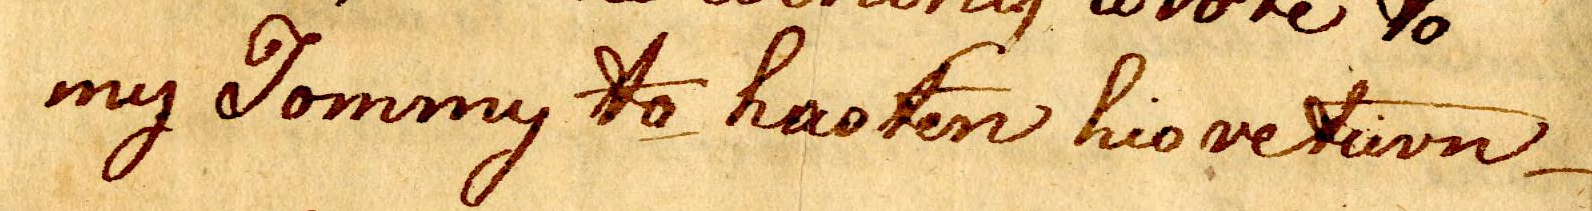my Tommy to hasten his return -
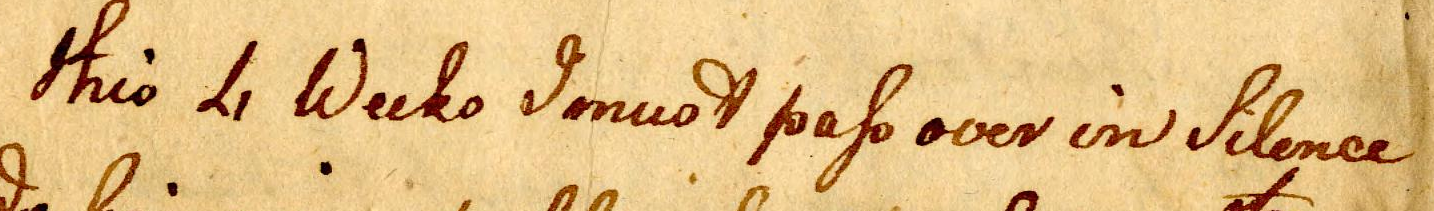this 4 Weeks I must pass over in Silence
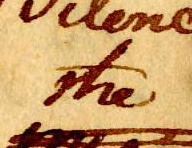the
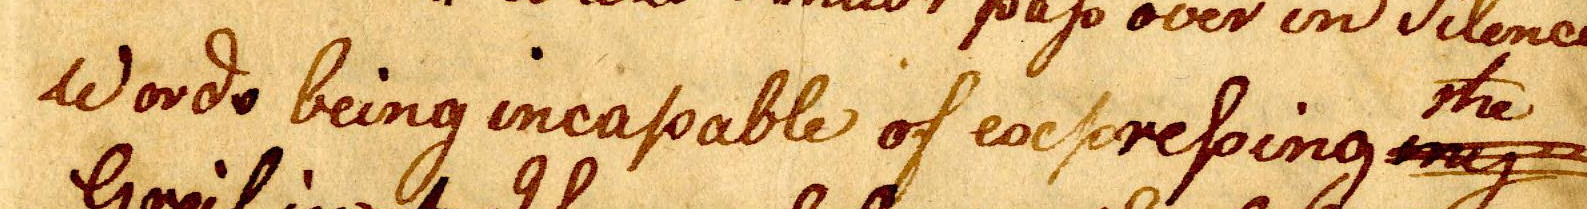Words being incapable of expressing [__]
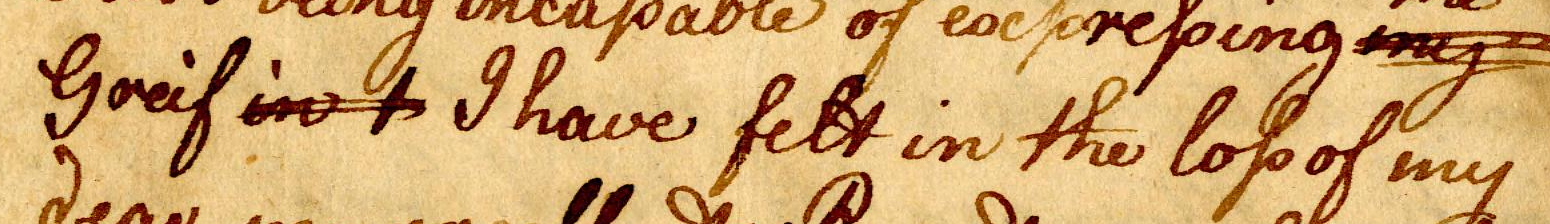Greif [___] I have felt in the loss of my
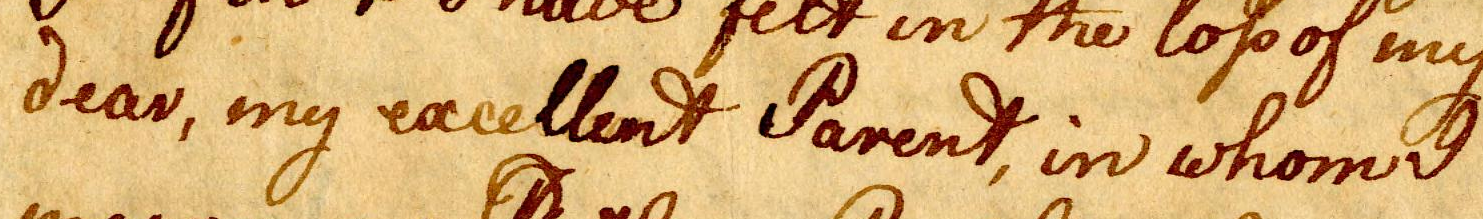dear, my excellent Parent, in whom I
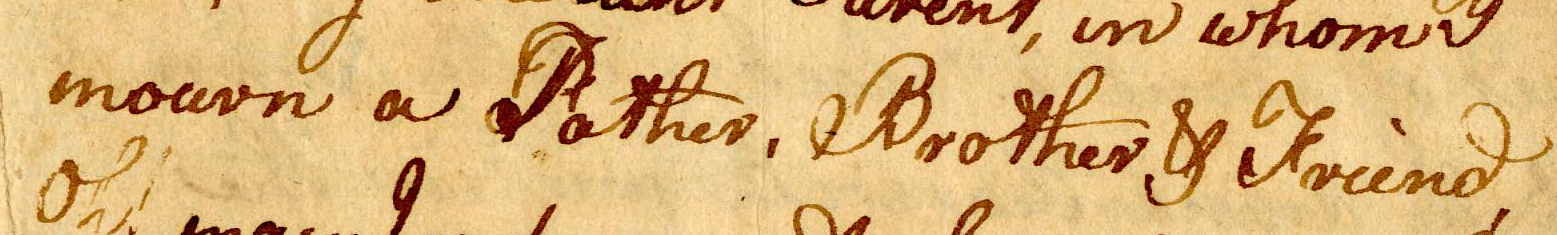mourn a Father, Brother & Friend
